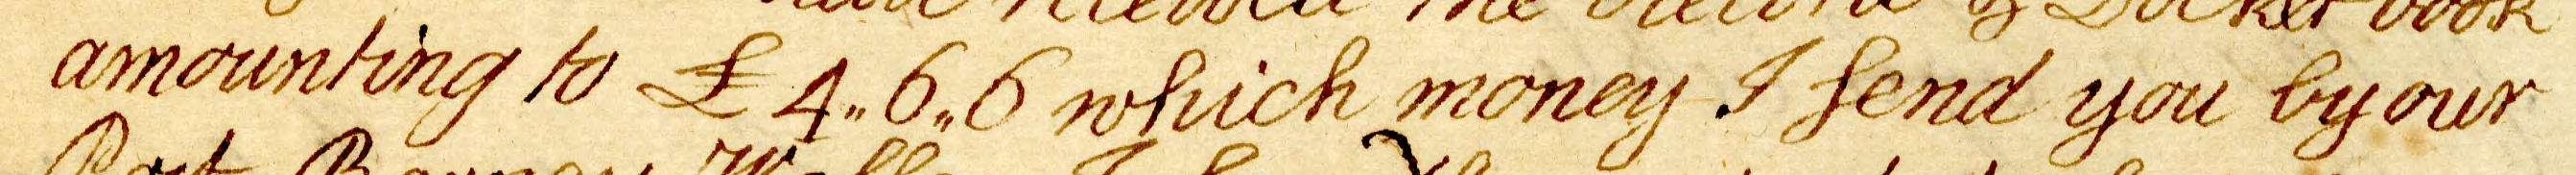amounting to £4..6..6 which money I send you by our
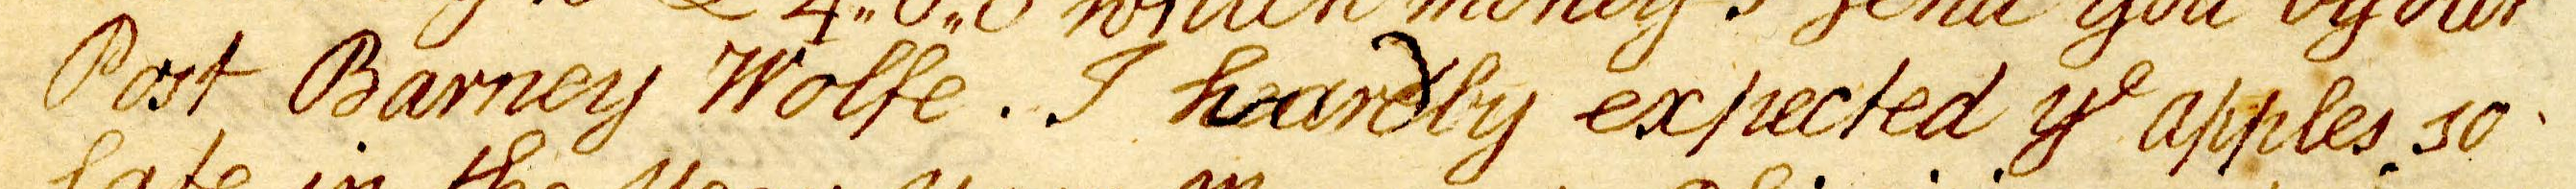Post Barney Wolfe. I hardly expected y^e Apples so
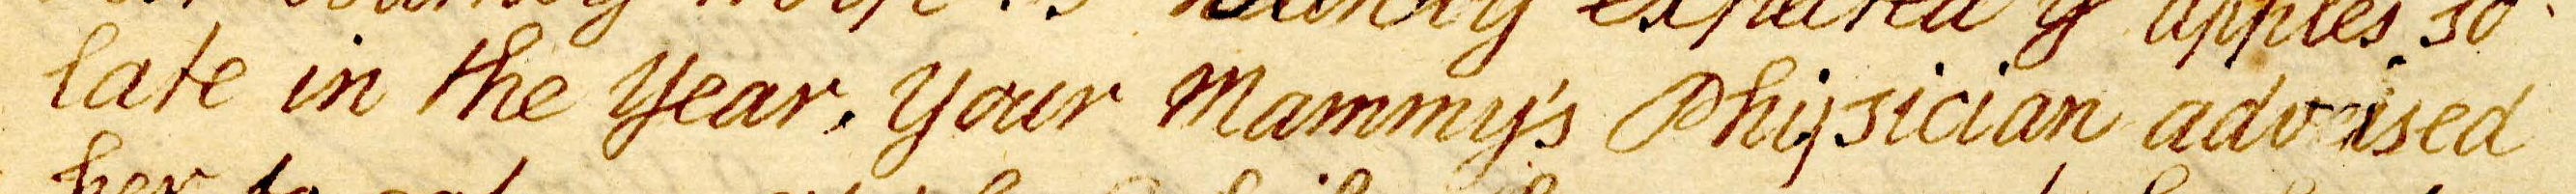late in the Year, your Mammy's Physician advised
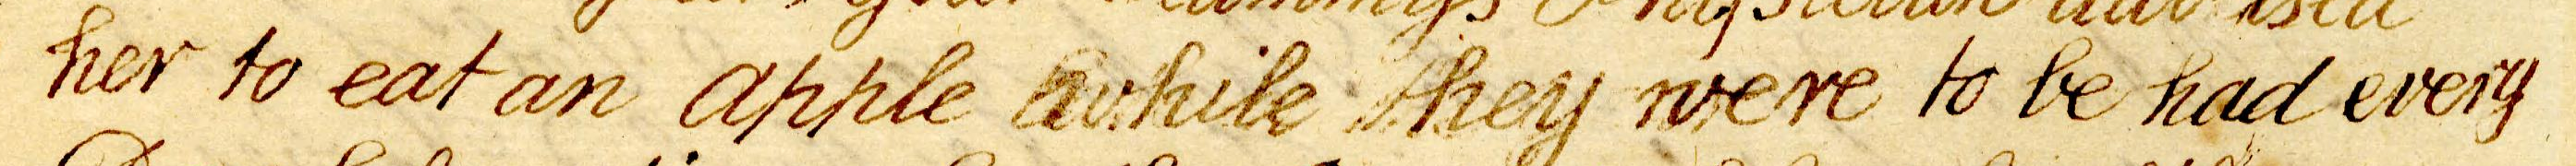her to eat an Apple while they were to be had every
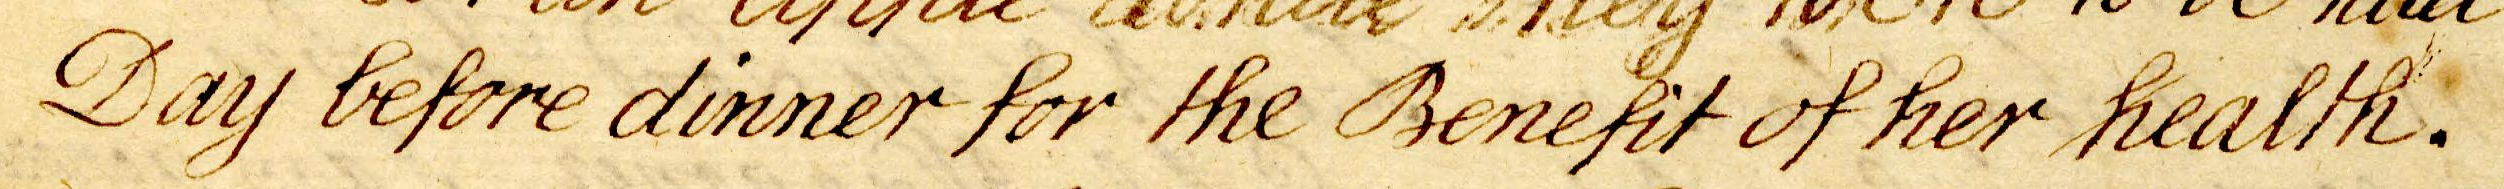Day before dinner for the Benefit of her health.
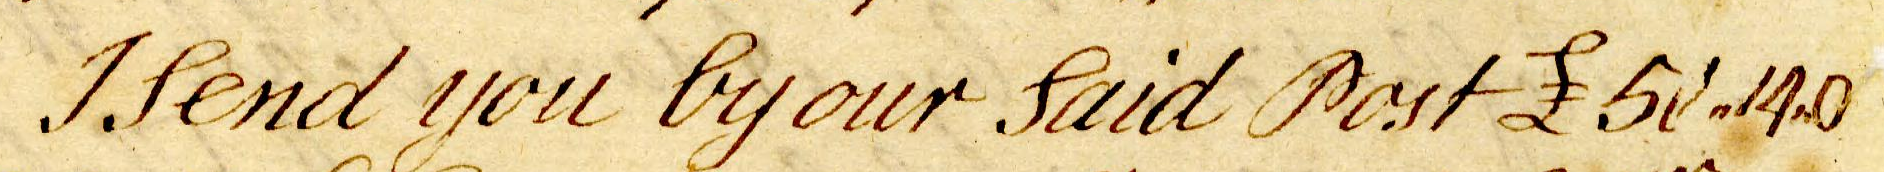I Send you by our Said Post £50..14..0
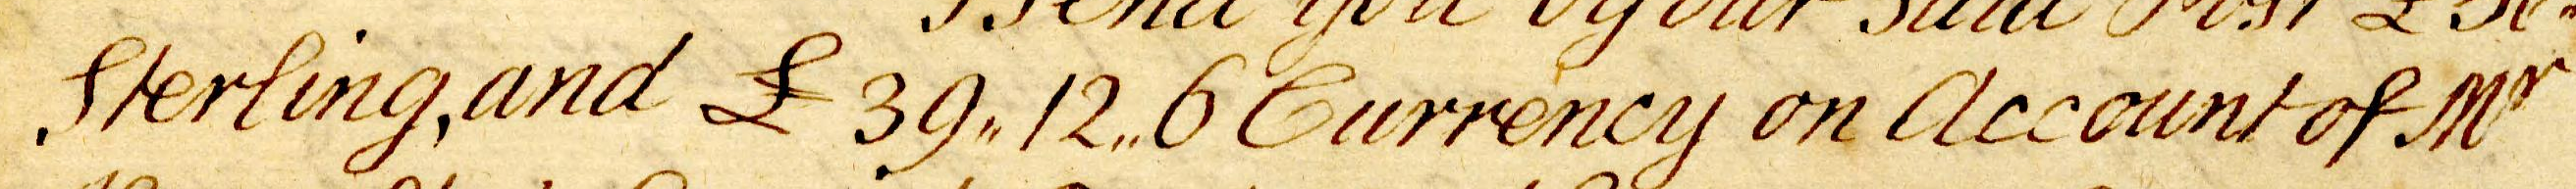Sterling, and £39..12..6 Currency on Account of M^r
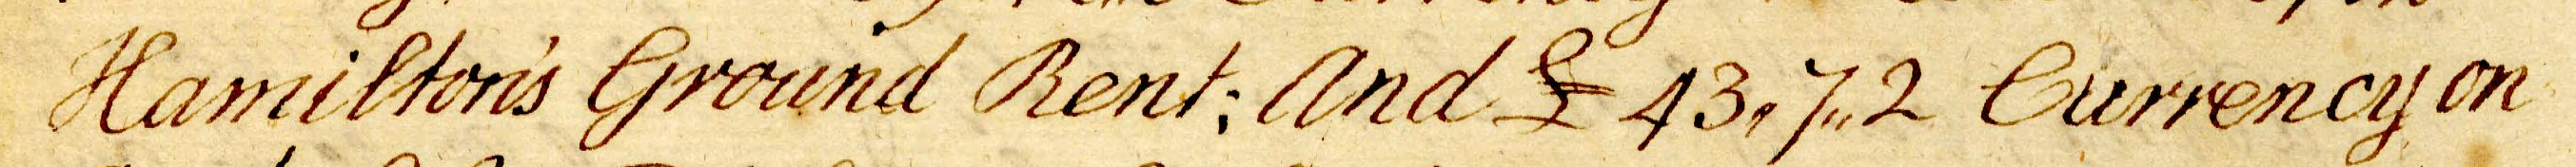Hamilton's Ground Rent; And £43..7..2 Currency on
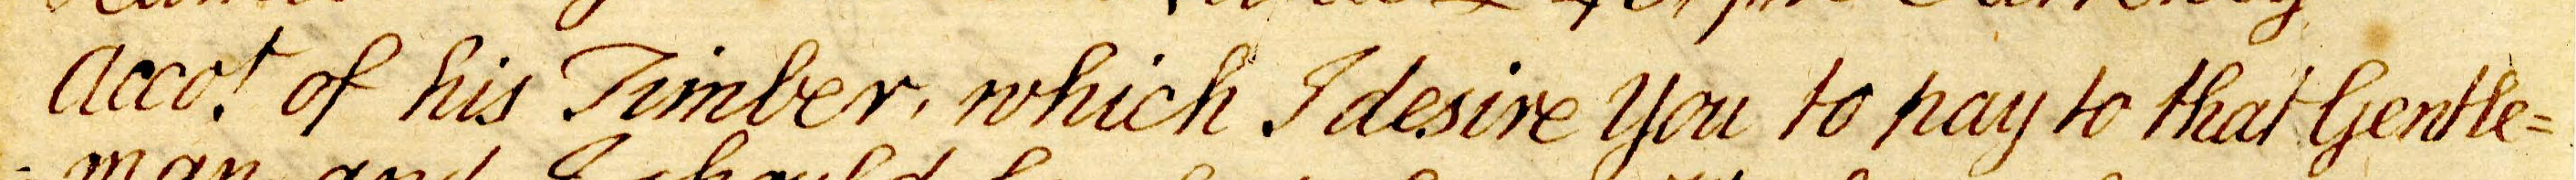Acco.^t of his Timber, which I desire You to pay to that Gentle-
